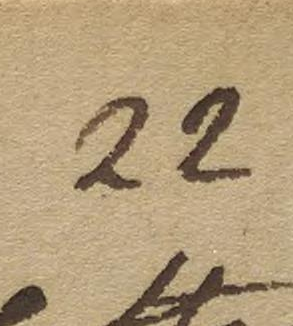22
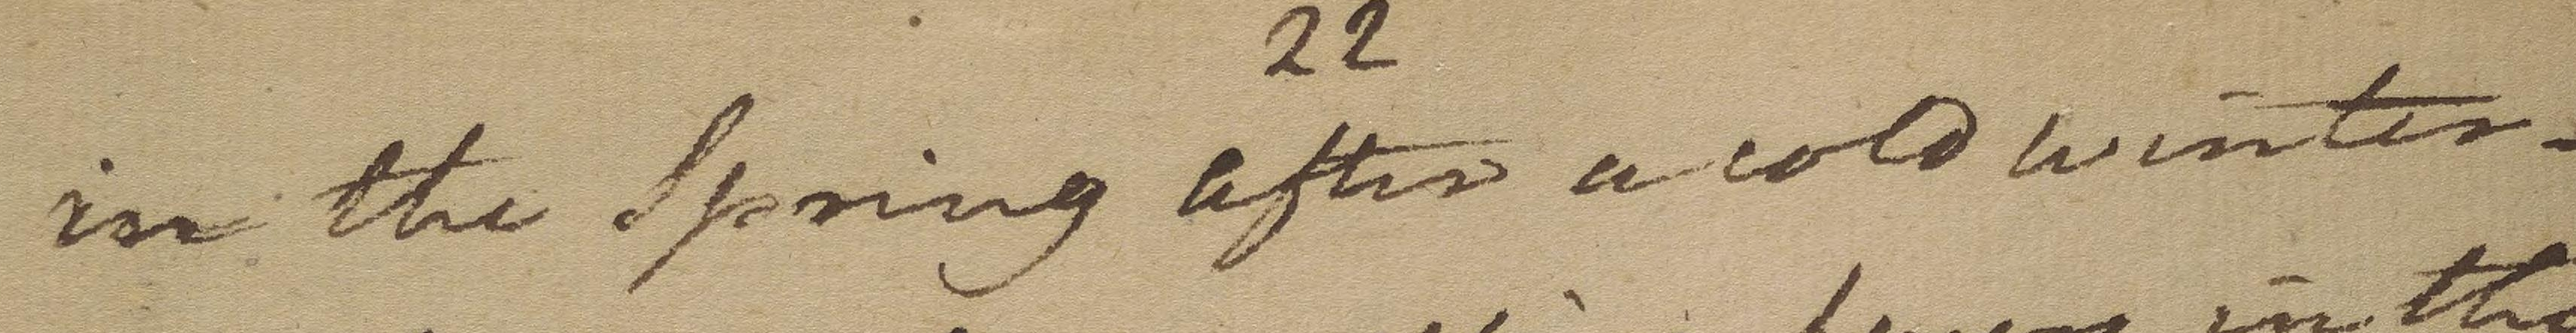in the Spring after a cold winter,
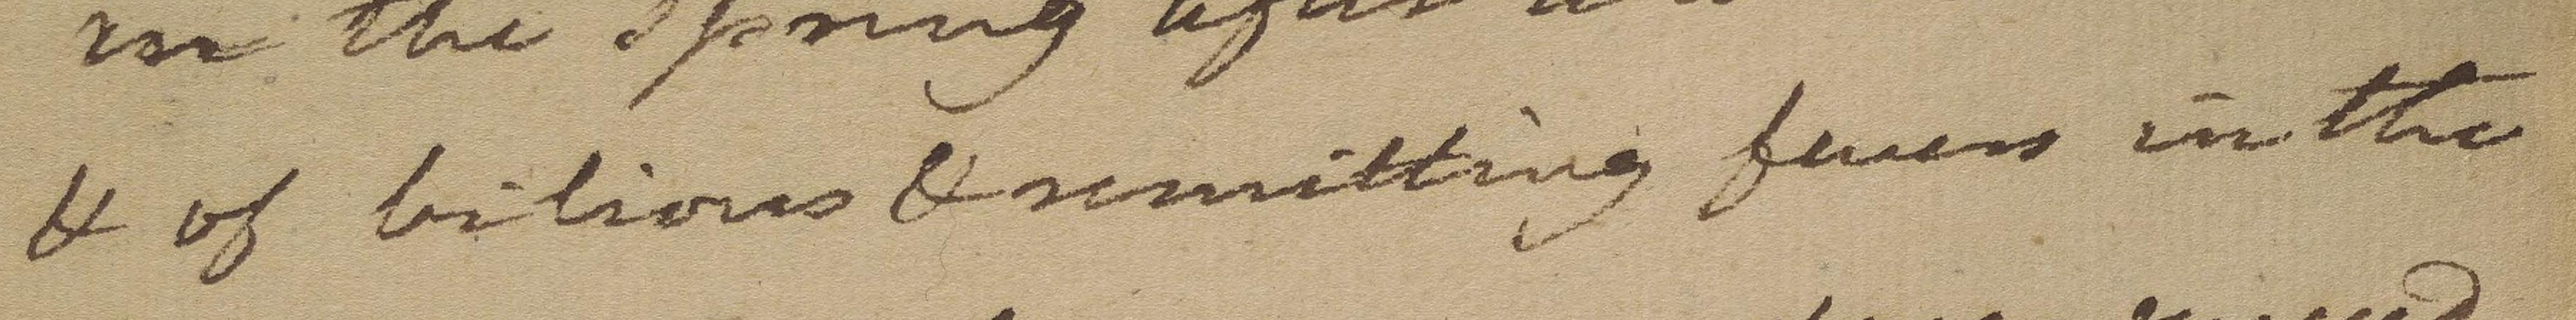& of bilious & remitting fevers in the
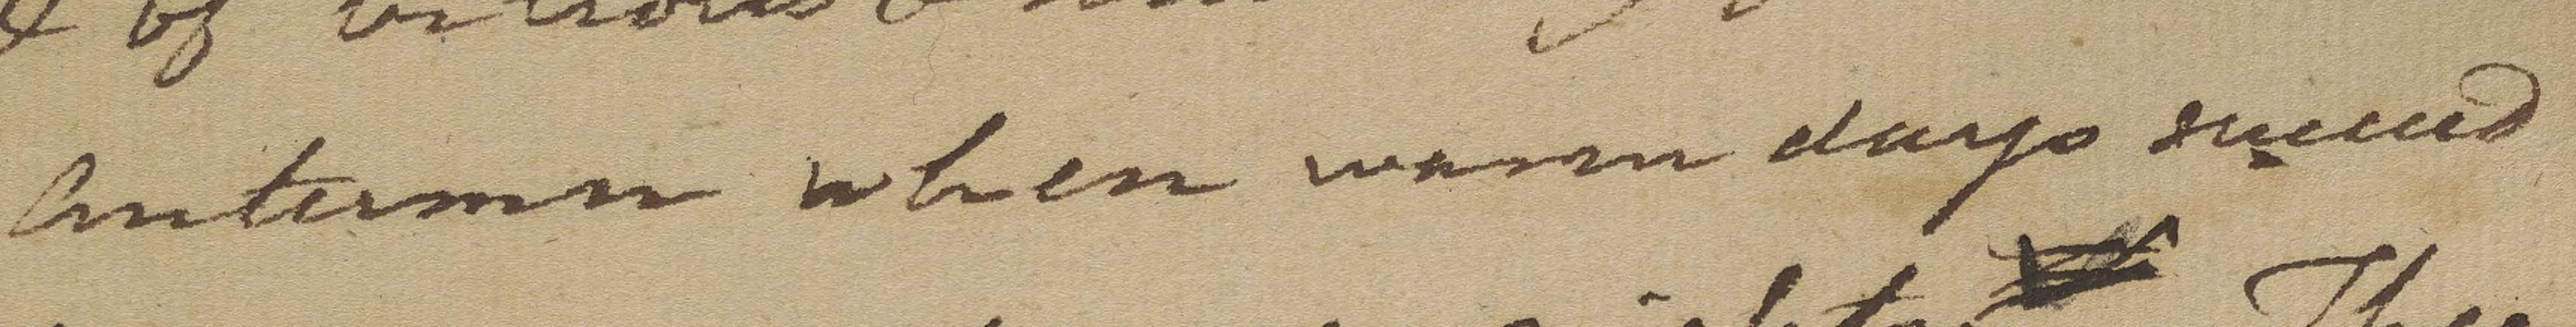autumn when warm days succeed
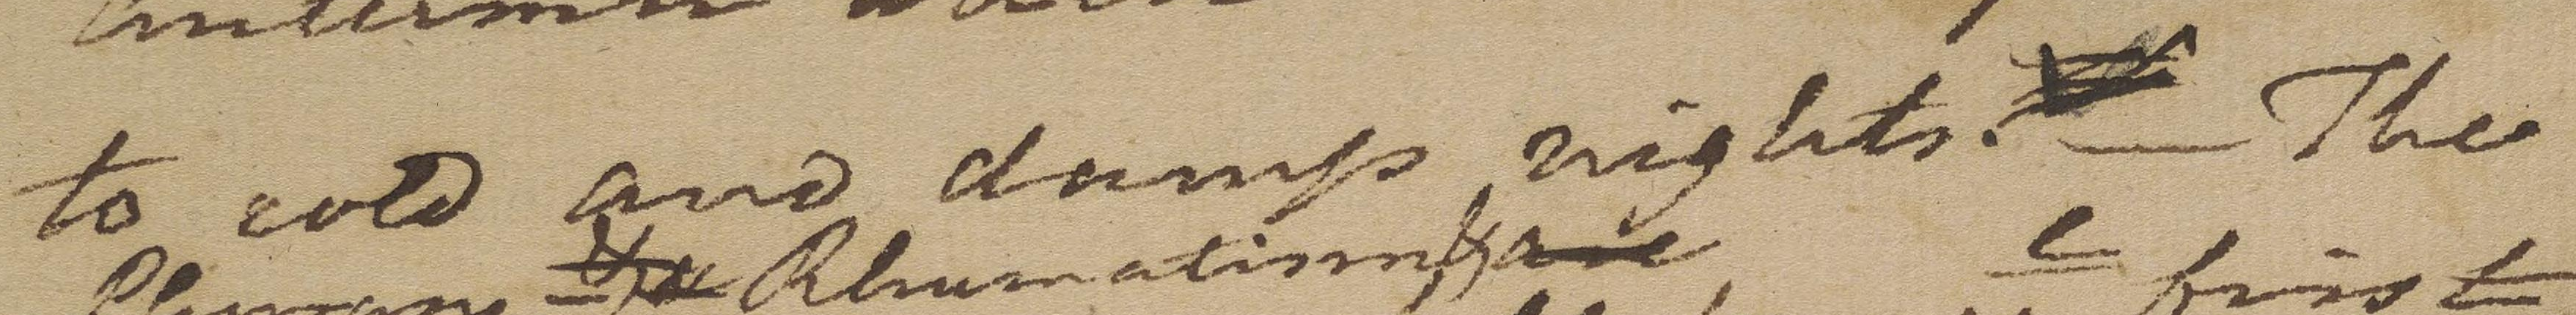to cold and damp nights. The
